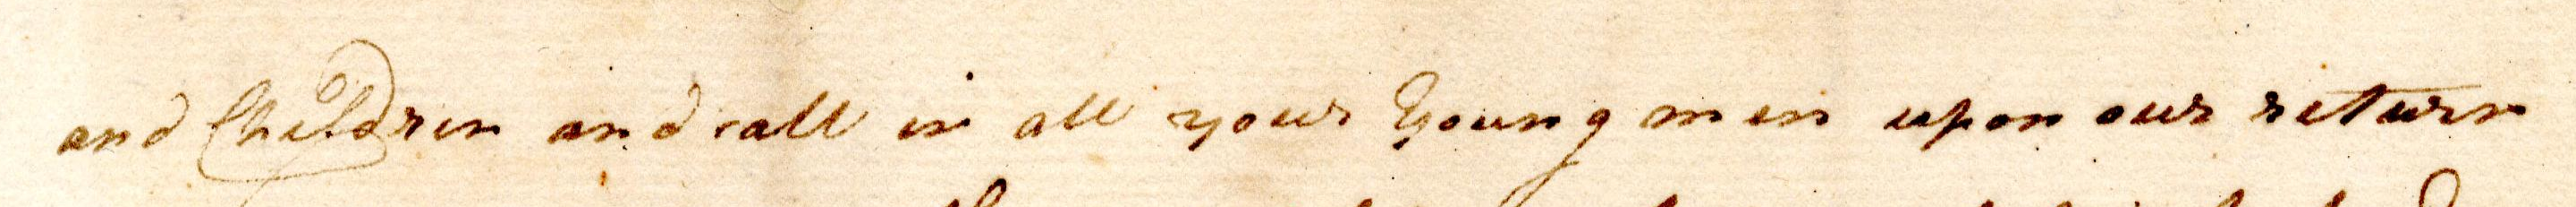and Children and call in all your Young men upon our return
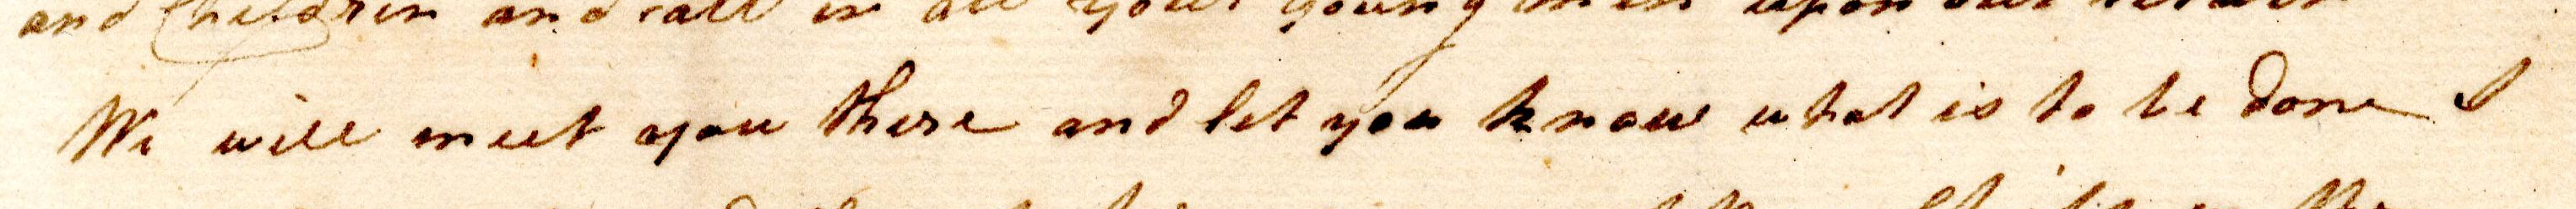We will meet you there and let you know what is to be done I
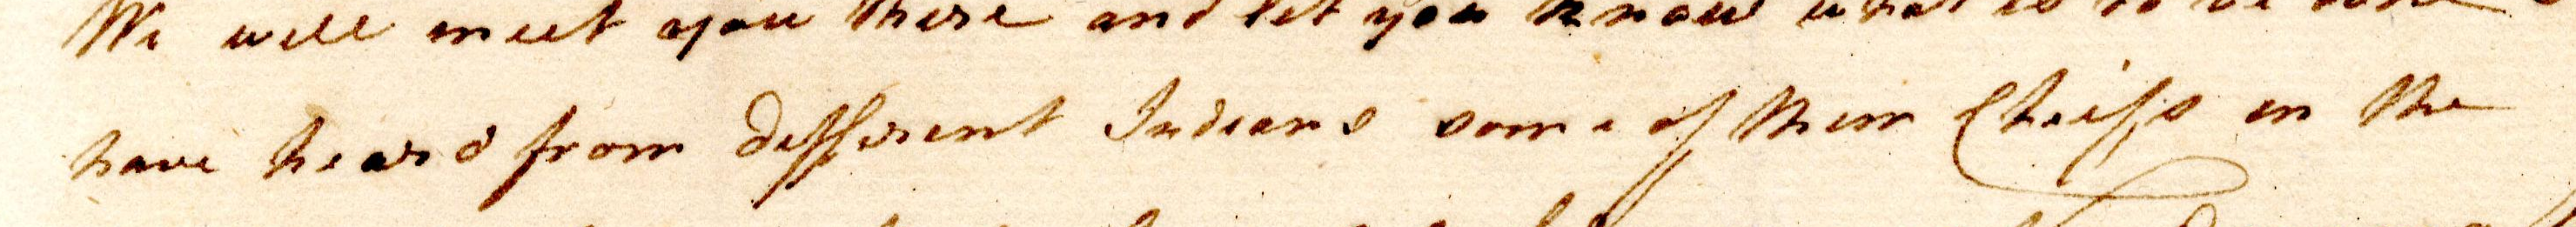have heard from different Indians some of their Chiefs in the
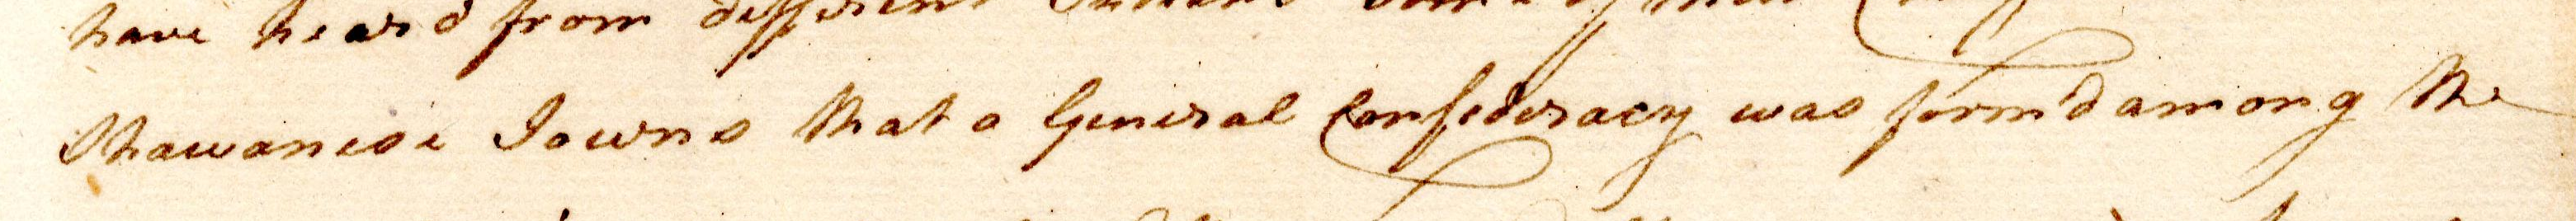Shawanese Towns that a General Confederacy was form'd among the
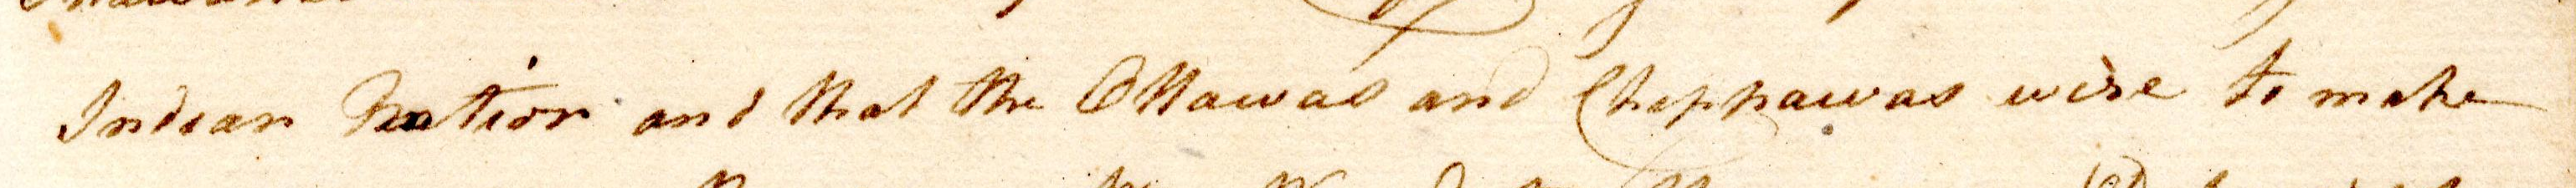Indian Nation and that the Ottawas and Chippawas were to make
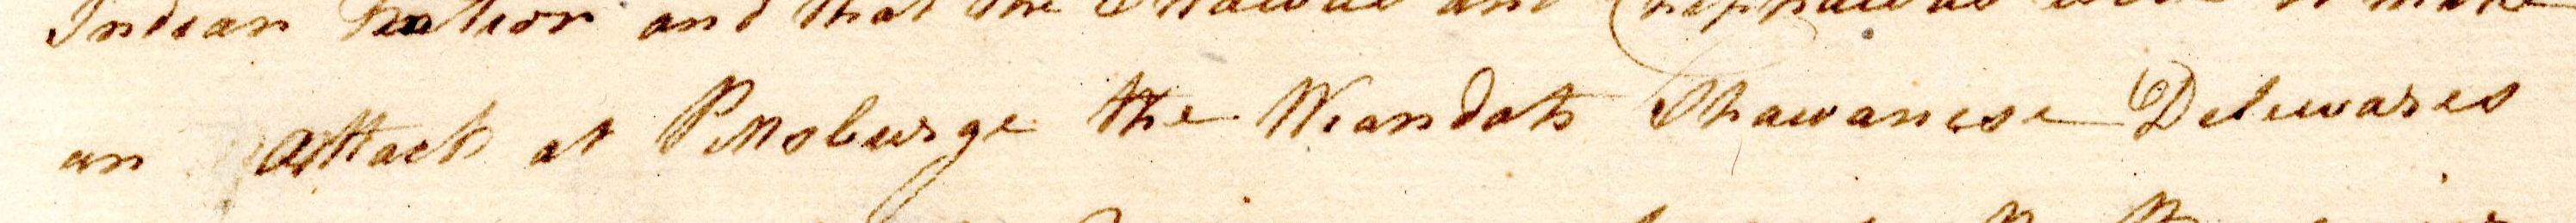an Attack at Pittsburge the Wiandats Shawanese Delawares
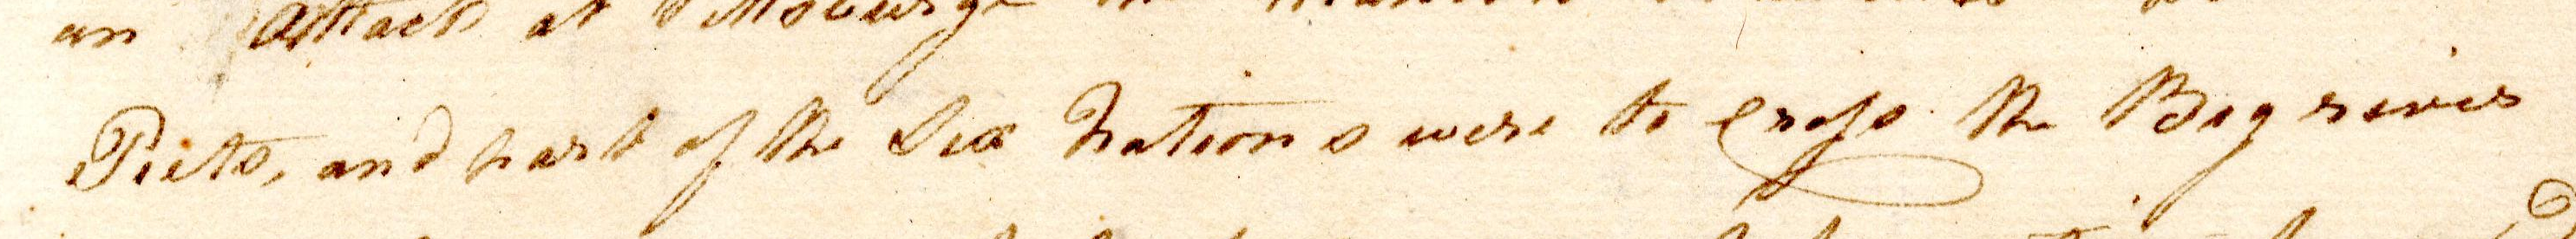Pieto, and part of the Six Nations were to Cross the Big river
